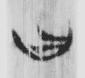曰
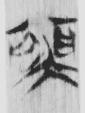{聑大}
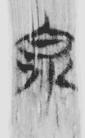余
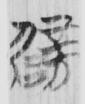辟
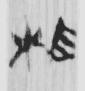相
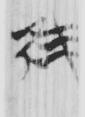隹
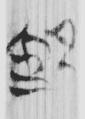卸
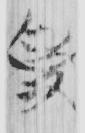事
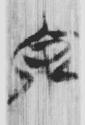余
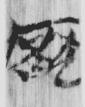厭
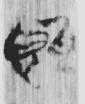既
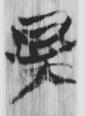異
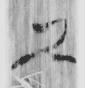氒
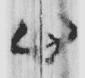心
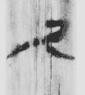氒
